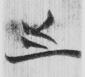之
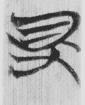𠭁
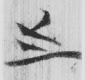之
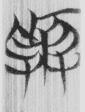與
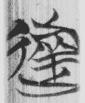{辶止㚔}
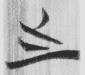之
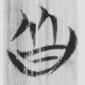皆
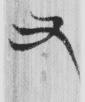又
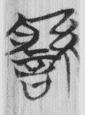䌛
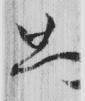也
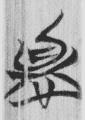{勺皿}
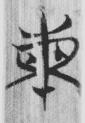柬
